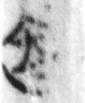智
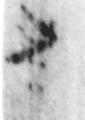寺
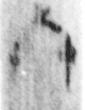夂（終）
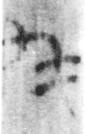求
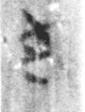母
